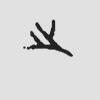出
